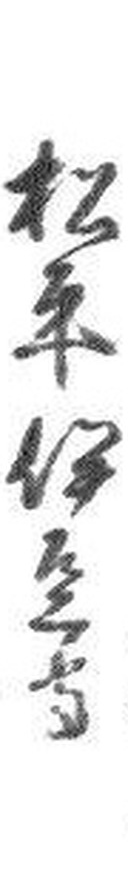松平伊豆守
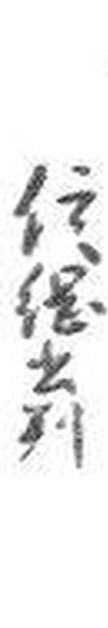信綱書判
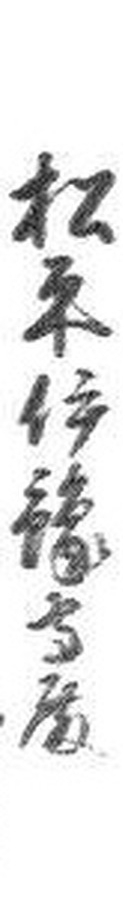松平伊豫守殿
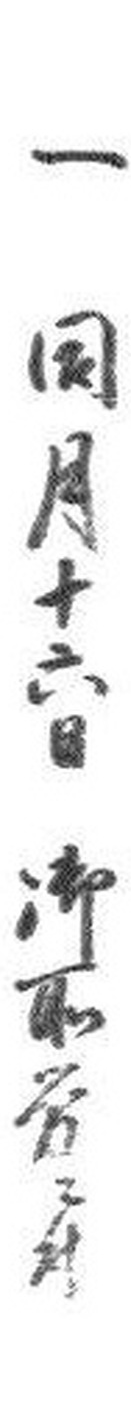一同月十六日御所労ニ付
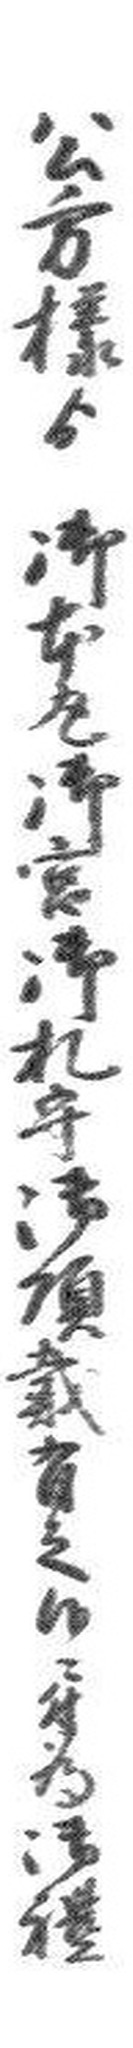公方様ゟ御本丸御宮御札守御頂戴有之候ニ付為御礼
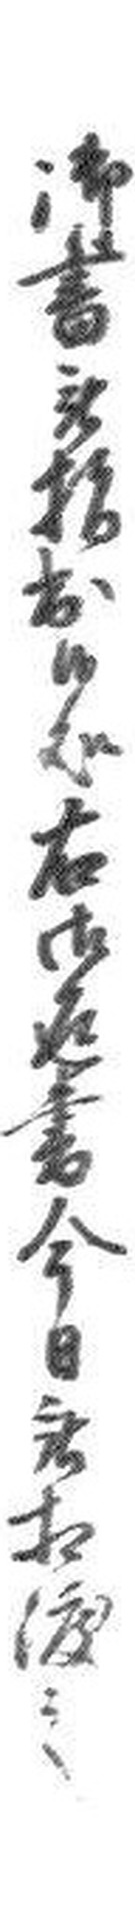御書被指出候処右御返書今日被相渡之

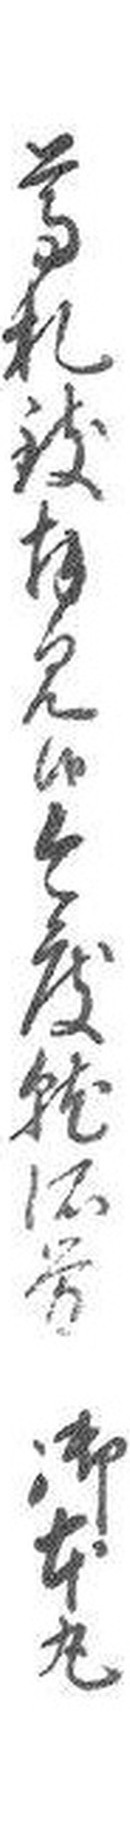尊札致拝見候今度就所労御本丸
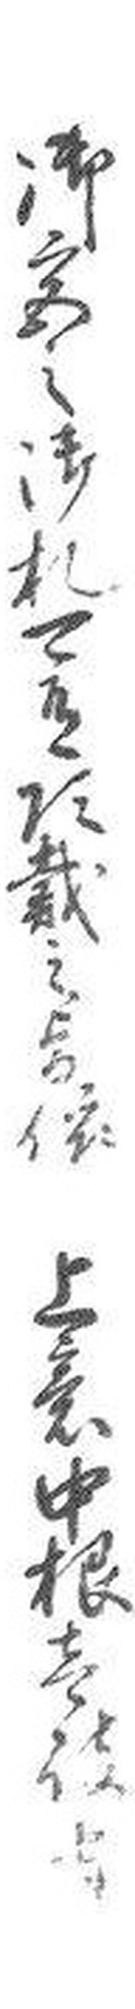御宮之御札可有頂戴之旨依上意中根壱岐守
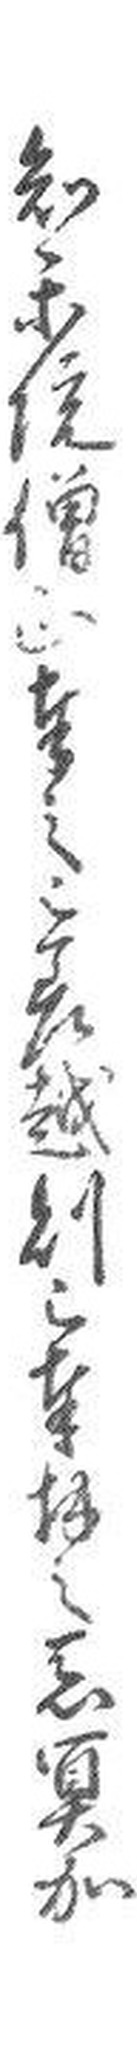知楽院僧正奉之被差越則被奉拝之忝冥加
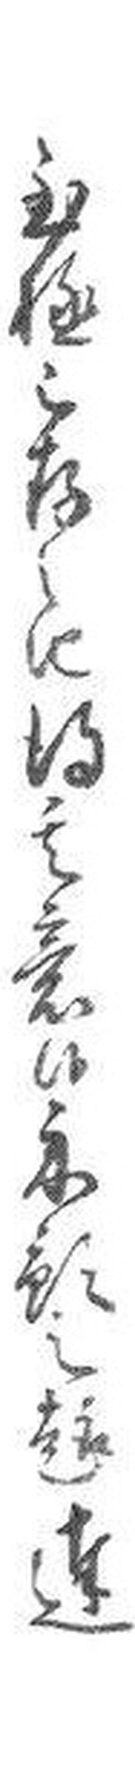至極被存之由得其意候示預之趣達
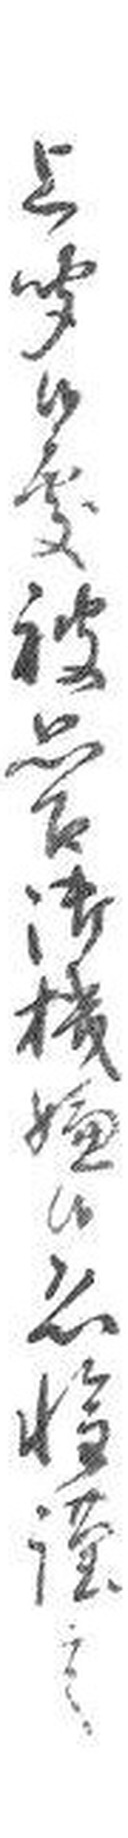上聞候処被思召御機嫌候恐惶謹言
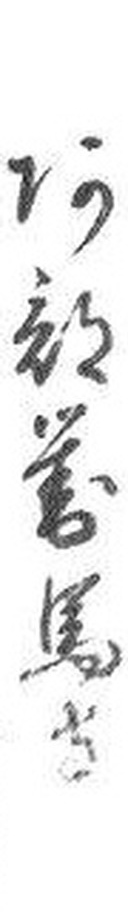阿部対馬守
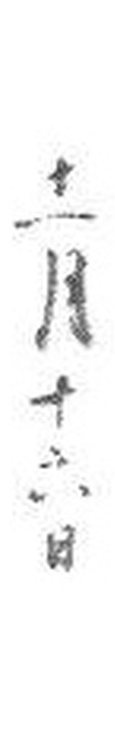十一月十六日
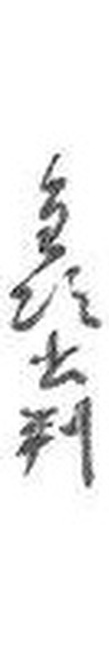重次書判
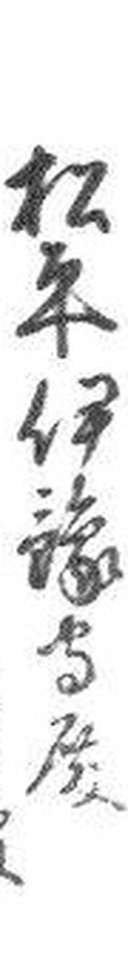松平伊予守殿
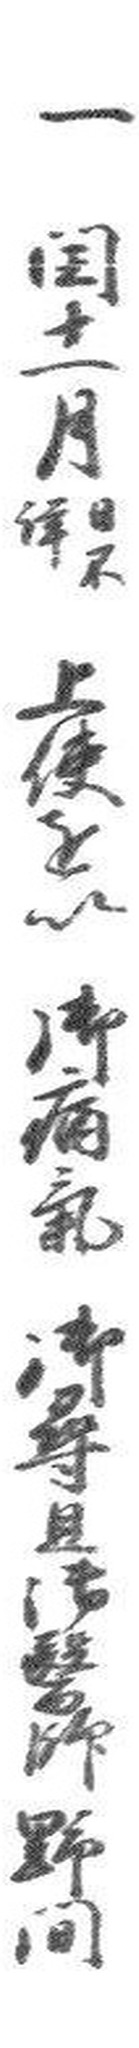一閏十一月日不詳上使を以御病気御尋且御医師野間
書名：家譜 四 忠昌公 従寛永七年到正保四年
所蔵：福井県文書館 Fukui Prefectural Archives
